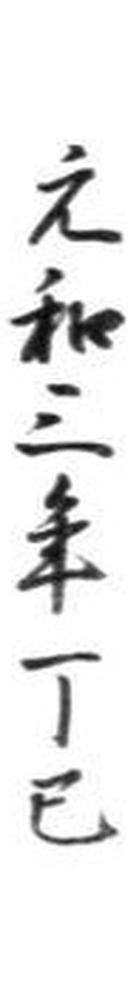元和三年丁巳
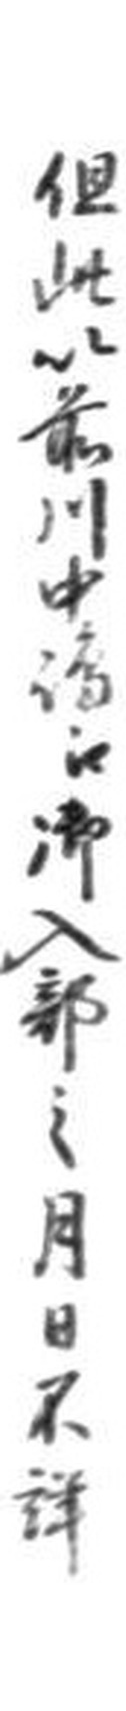但此以前川中島江御入部之月日不詳

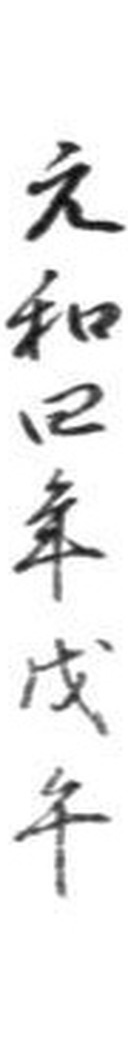元和四年戊午
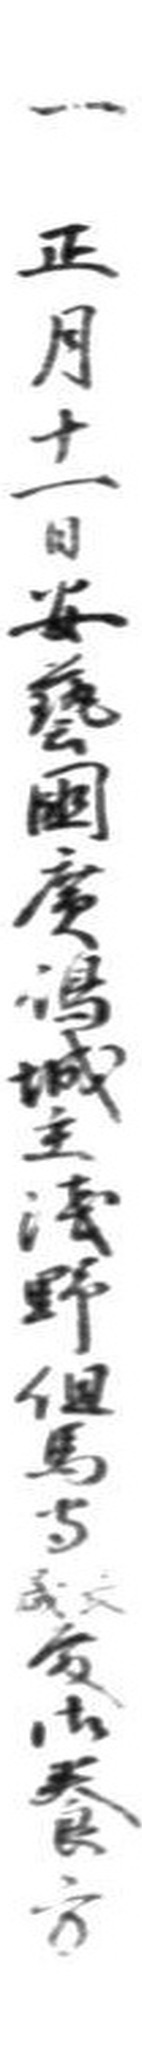一正月十一日安芸国広島城主浅野但馬守長晟殿御養方
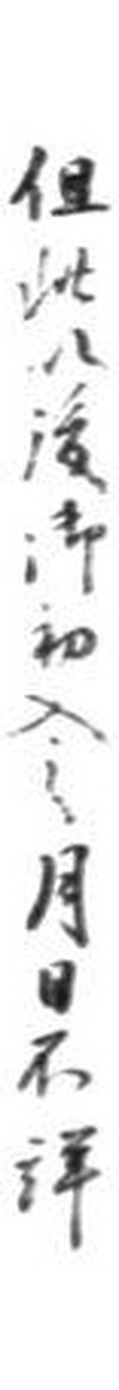但此以後御初入之月日不詳
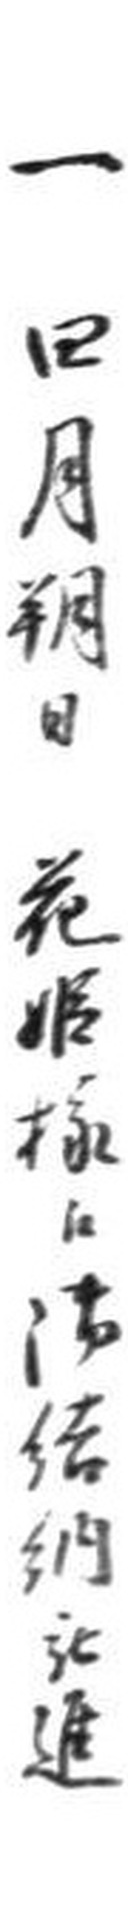一四月朔日花姫様江御結納被進

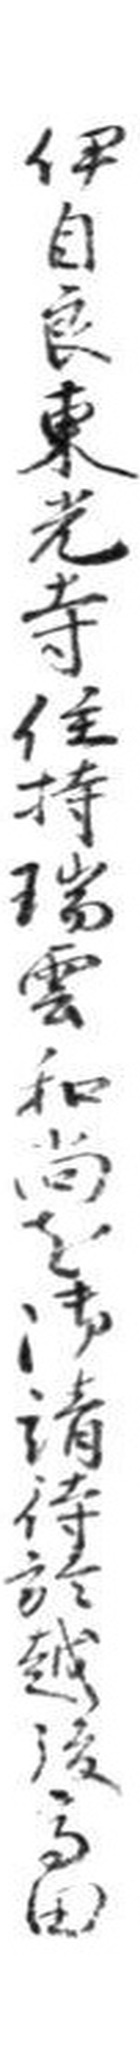伊自良東光寺住持瑞雲和尚を御請待於越後高田
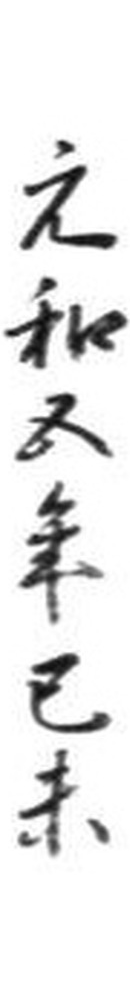元和五年己未
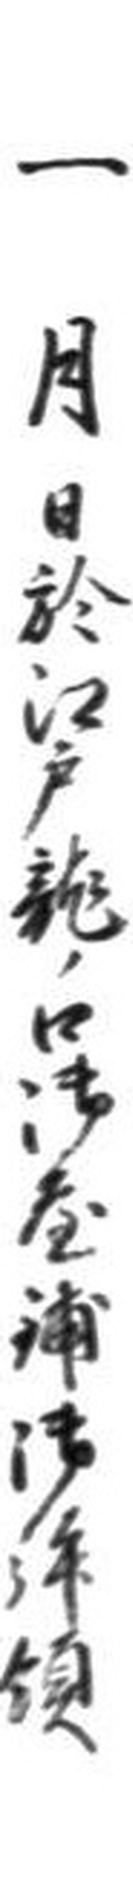一月日於江戸龍ノ口御屋鋪御拝領
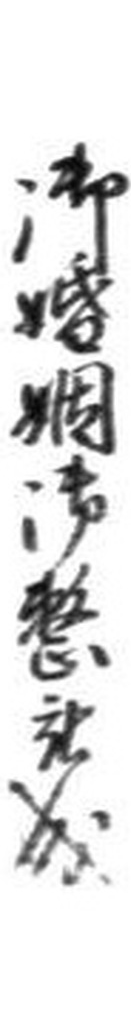御婚姻御整被成

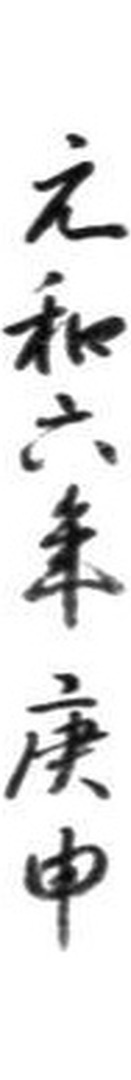元和六年庚申
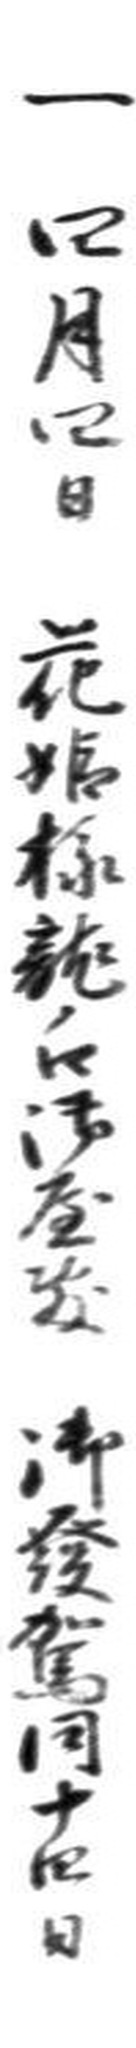一四月四日花姫様龍ノ口御屋敷御発駕同十四日
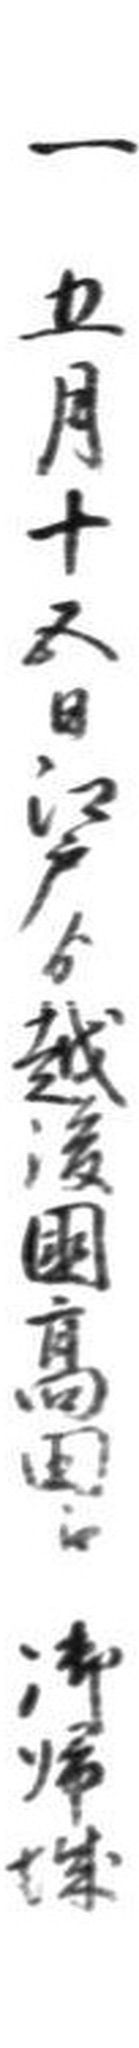一五月十五日江戸ゟ越後国高田江御帰城
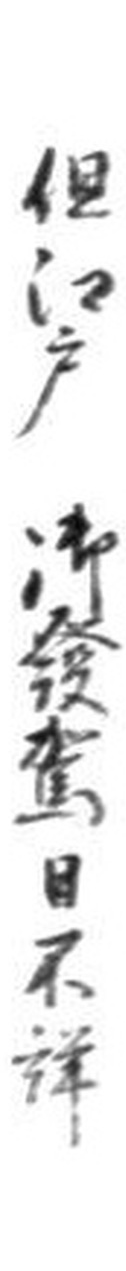但江戸御発駕日不詳
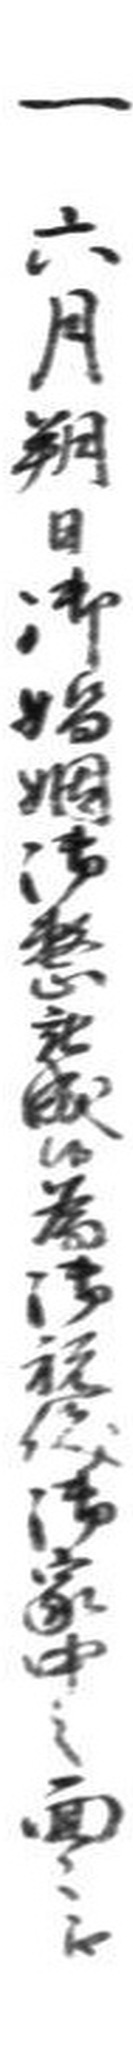一六月朔日御婚姻御整被成候為御祝儀御家中之面々江
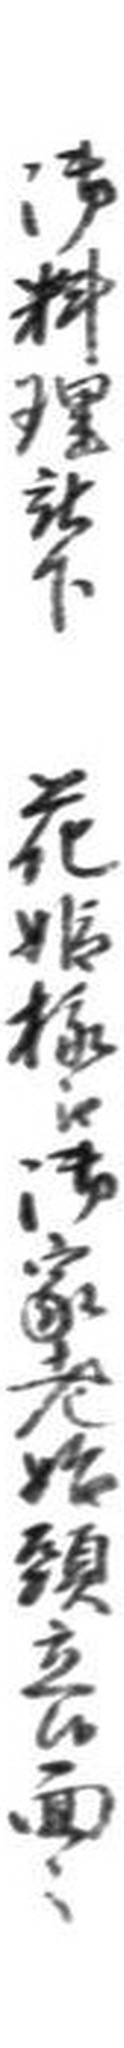御料理被下花姫様江御家老始頭立候面々
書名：家譜 三 忠昌公 従慶長八年到寛永六年
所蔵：福井県文書館 Fukui Prefectural Archives
